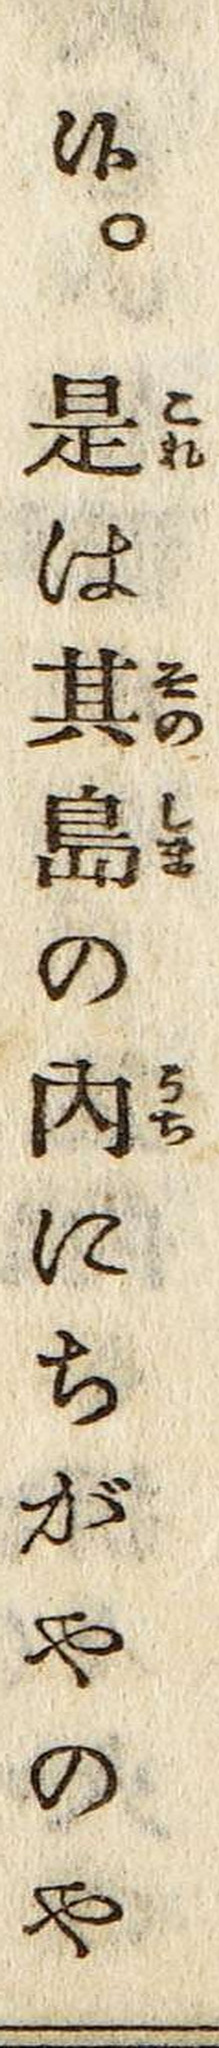候。是は其島の内にちがやのや
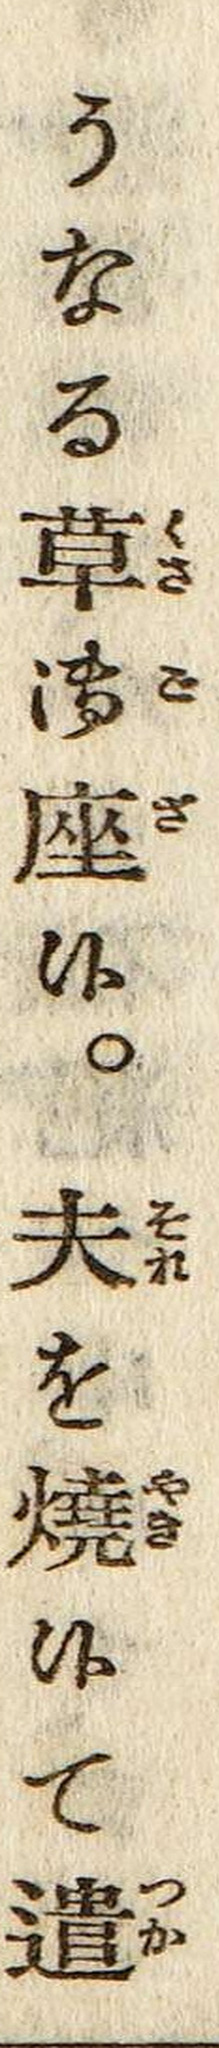うなる草御座候。夫を焼候て遣

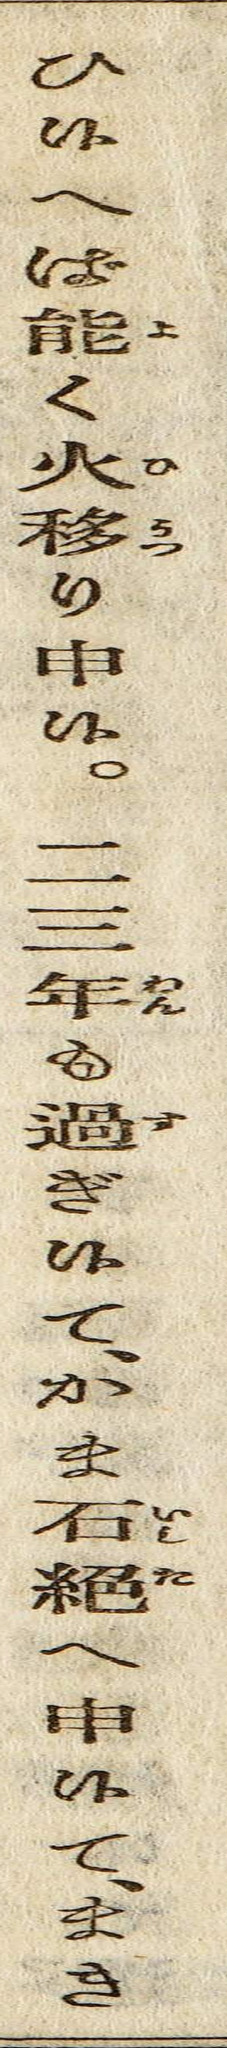ひ候へば能く火移り申候。二三年も過ぎ候て、かま石絶へ申候て、まき
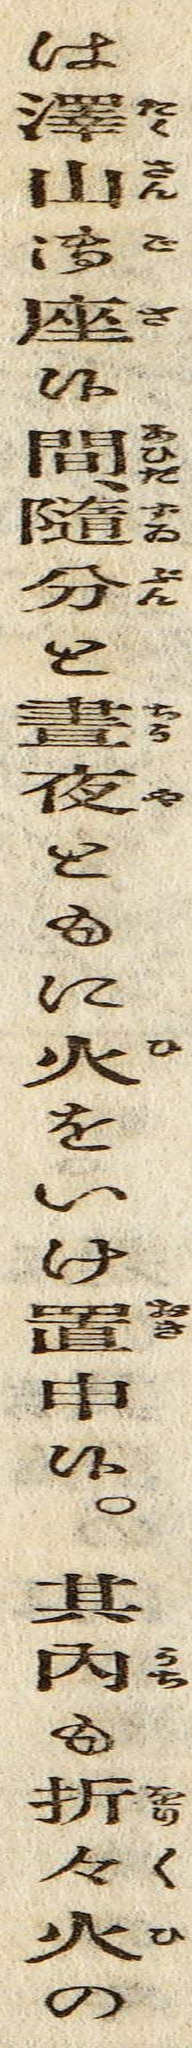は沢山御座候間、随分と昼夜ともに火をいけ置申候。其内も折々火の
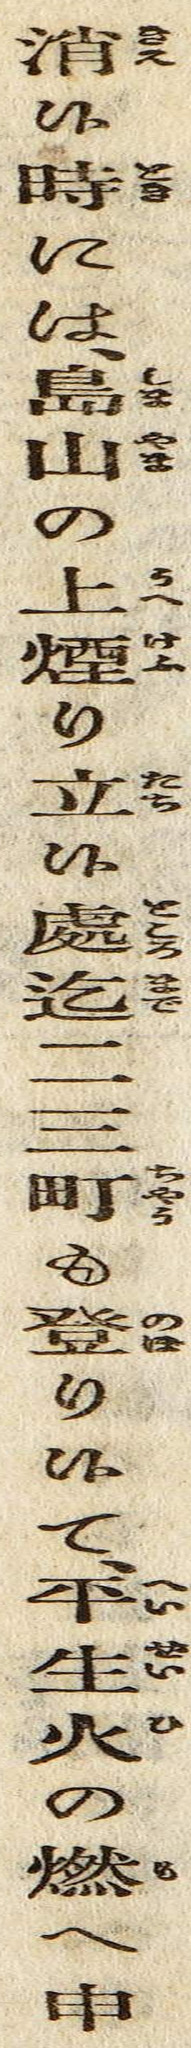消候時には、島山の上煙り立候処迄二三町も登り候て、平生火の燃へ申
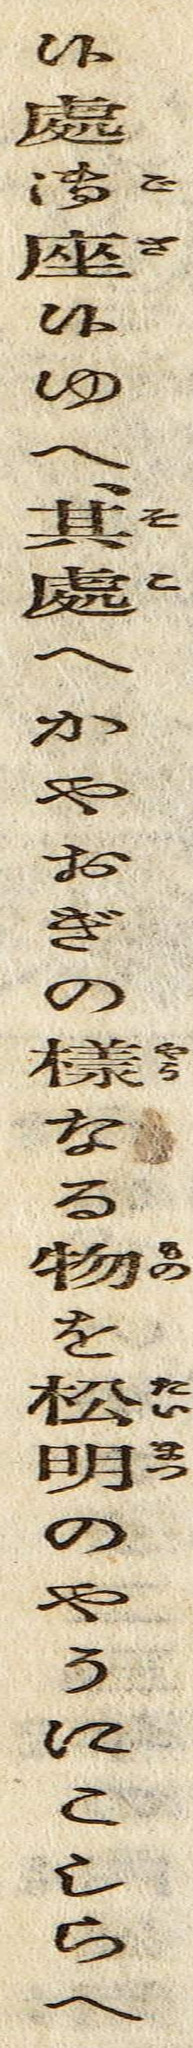候処御座候ゆへ、其処へかやおぎの様なる物を松明のやうにこしらへ
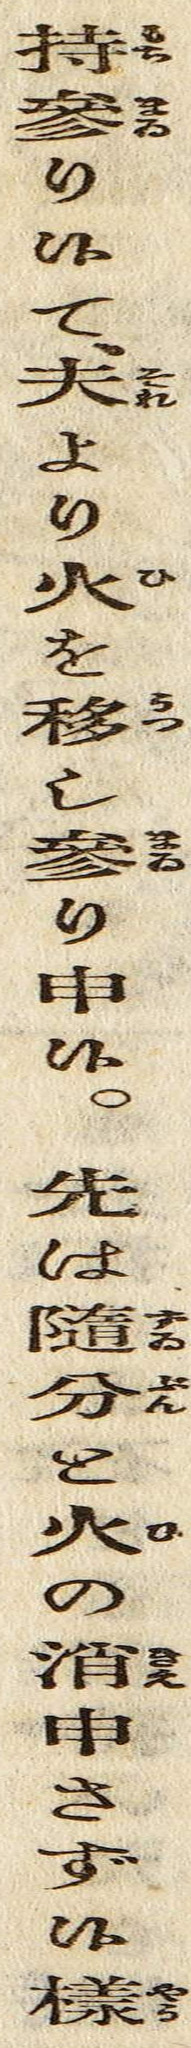持参り候て、夫より火を移し参り申候。先は随分と火の消申さず候様
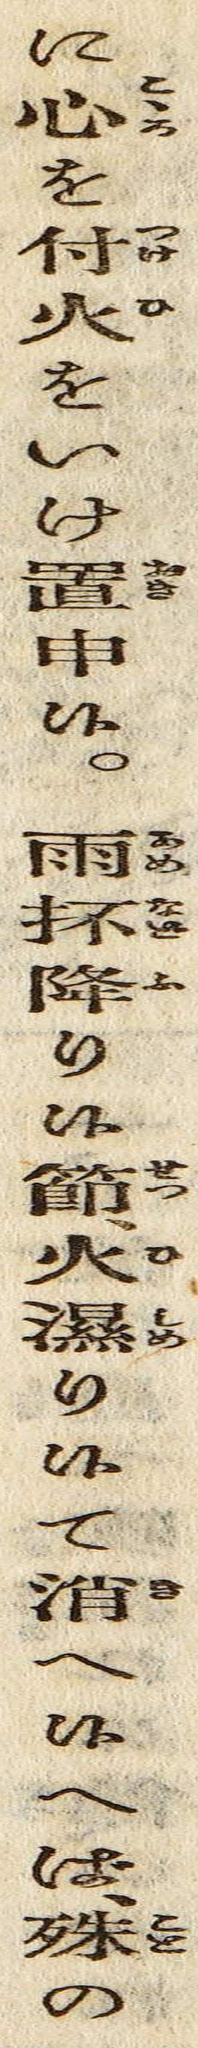に心を付火をいけ置申候。雨抔降り候節、火湿り候て消へ候へば、殊の
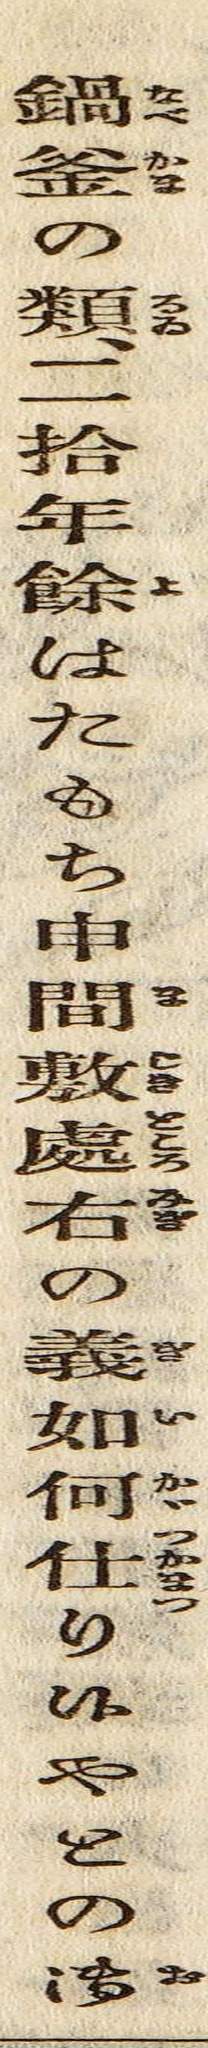鍋釜の類、二拾年余はたもち申間敷処右の義如何仕り候やとの御
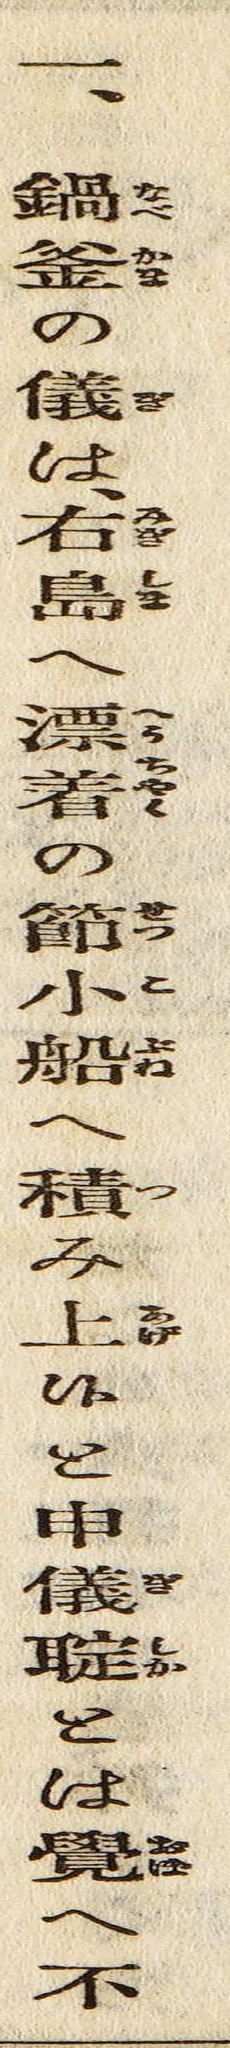一、鍋釜の儀は、右島へ漂着の節小船へ積み上候と申儀聢とは覚へ不
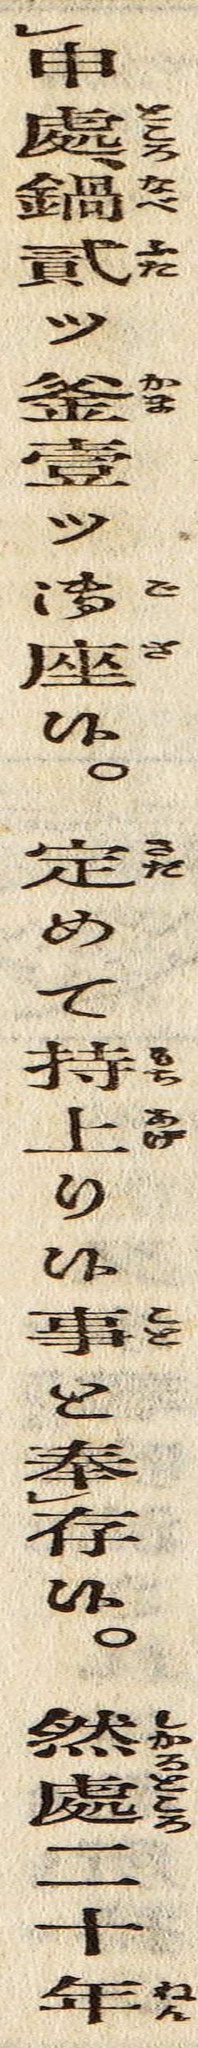申処、鍋弐ツ釜壱ツ御座候。定めて持上り候事と奉存候。然処二十年
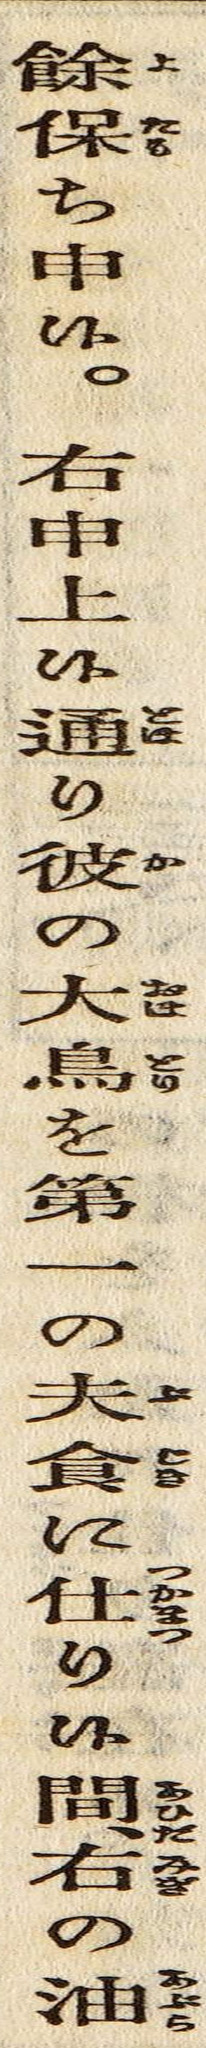余保ち申候。右申上候通り彼の大鳥を第一の夫食に仕り候間、右の油
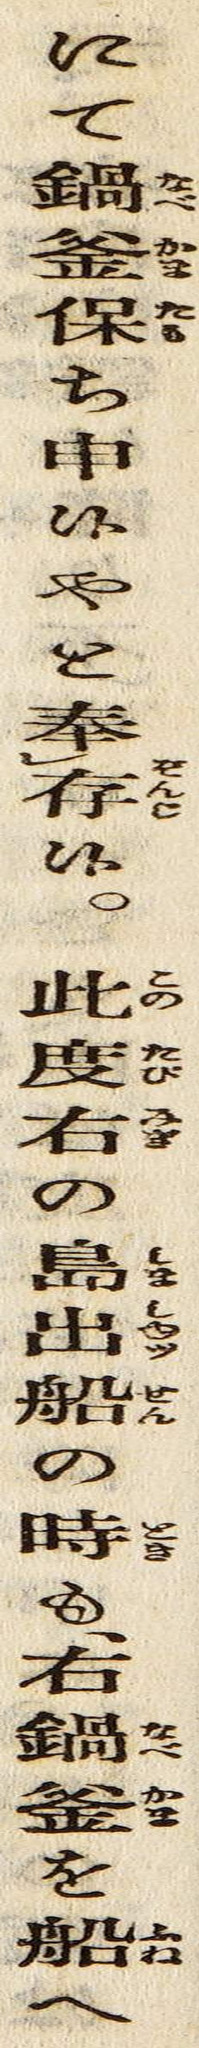にて鍋釜保ち申候やと奉存候。此度右の島出船の時も、右鍋釜を船へ
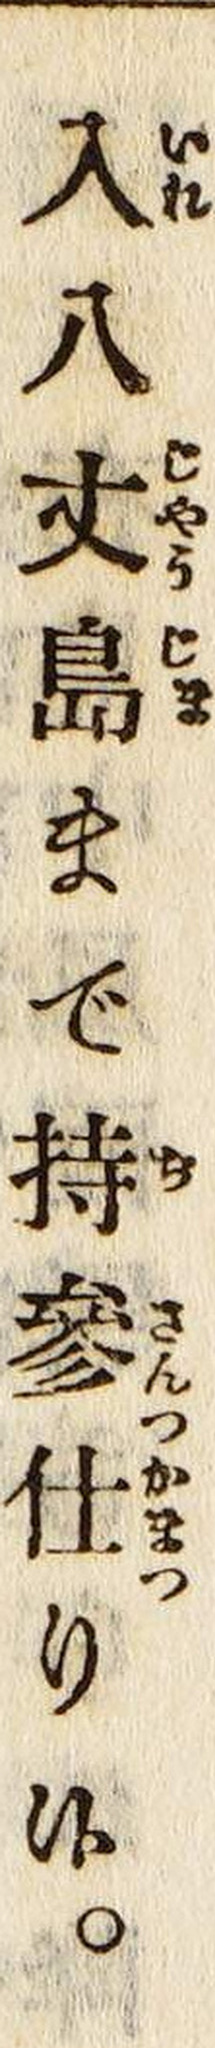入八丈島まで持参仕り候。
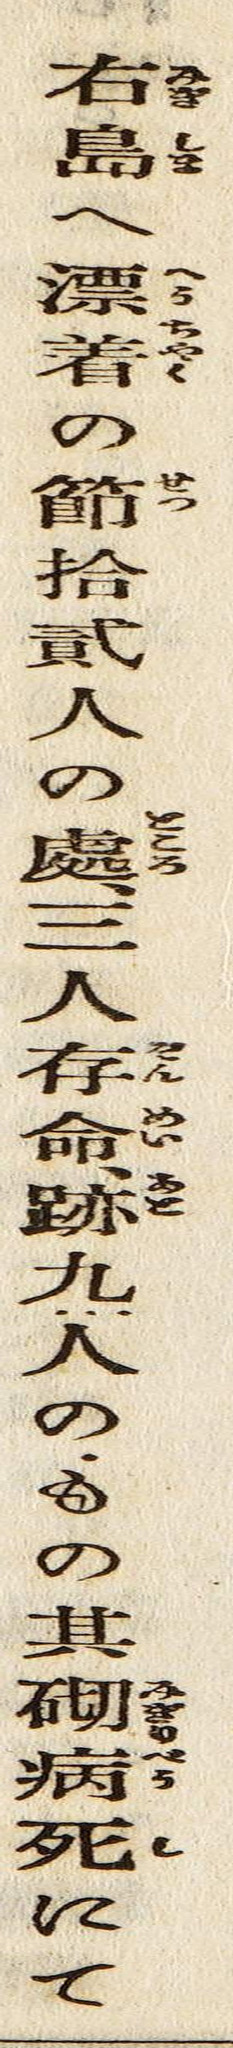右島へ漂着の節拾弐人の処、三人存命、跡九人のもの其砌病死にて
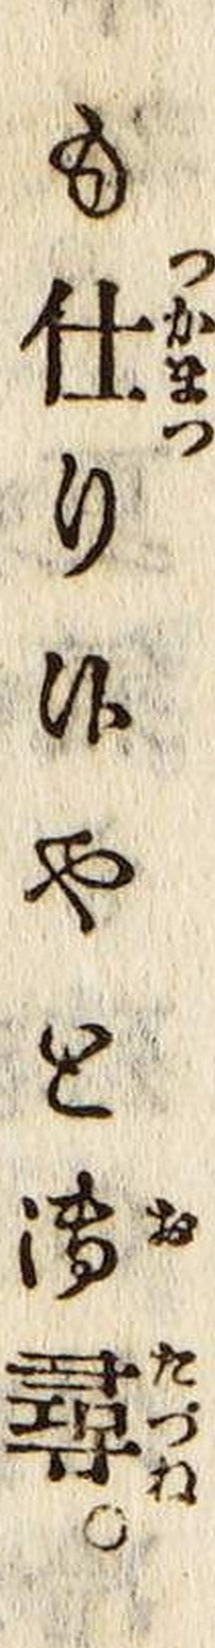も仕り候やと御尋。
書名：日本漂流譚
